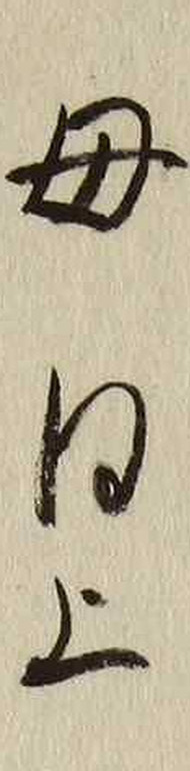母同上

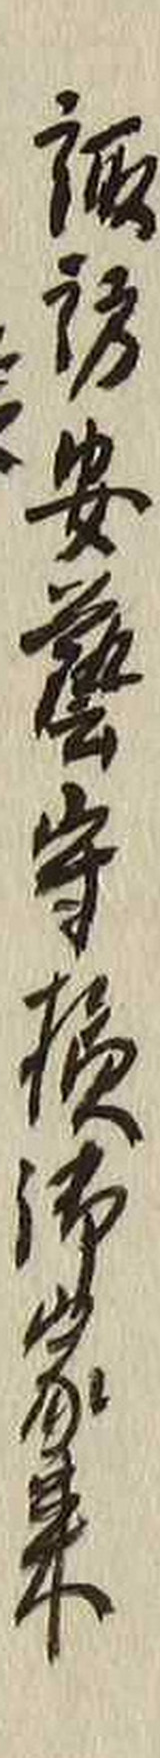諏訪安芸守様御家来
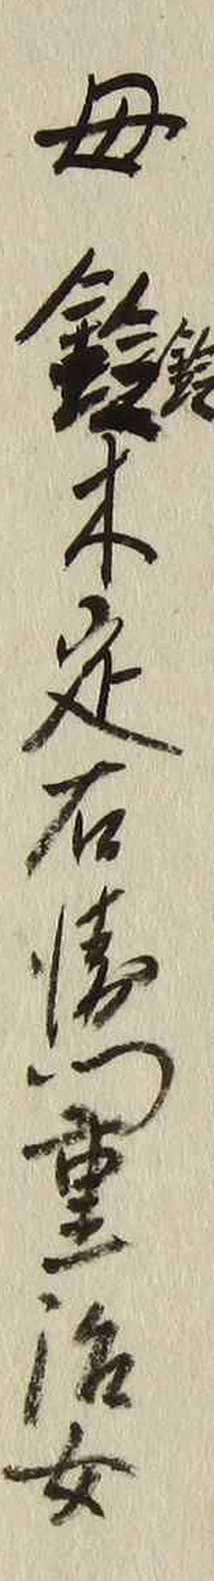母鈴木定右衛門重治女
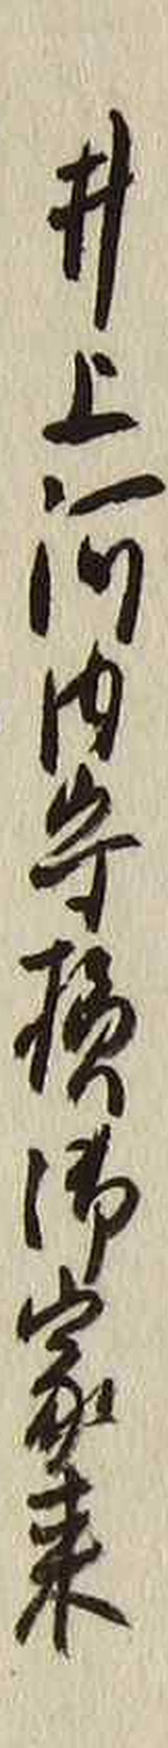井上河内守様御家来
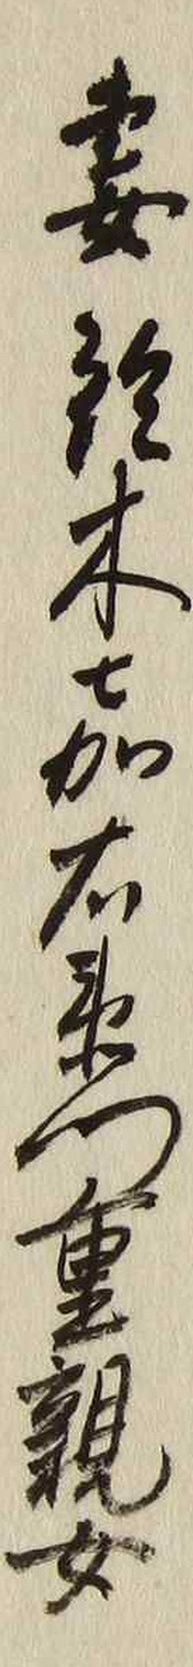妻鈴木嘉右衛門重親女
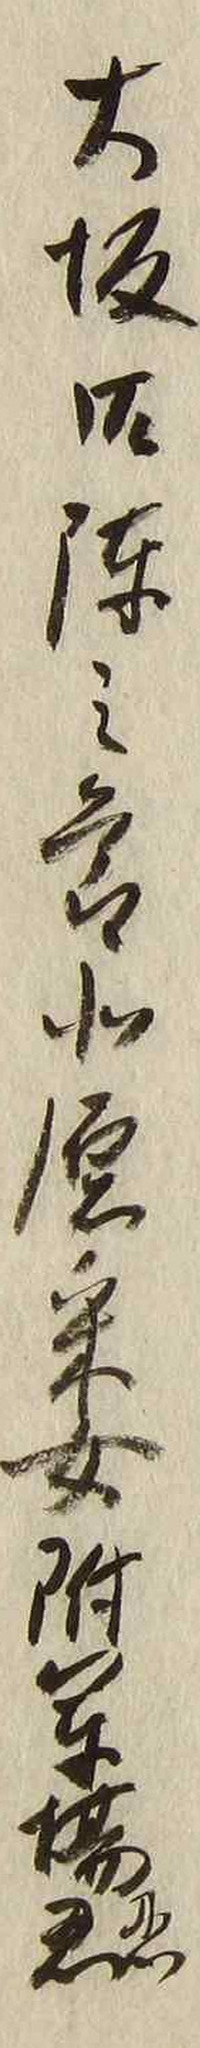大坂御陣之節北原采女附軍場忍

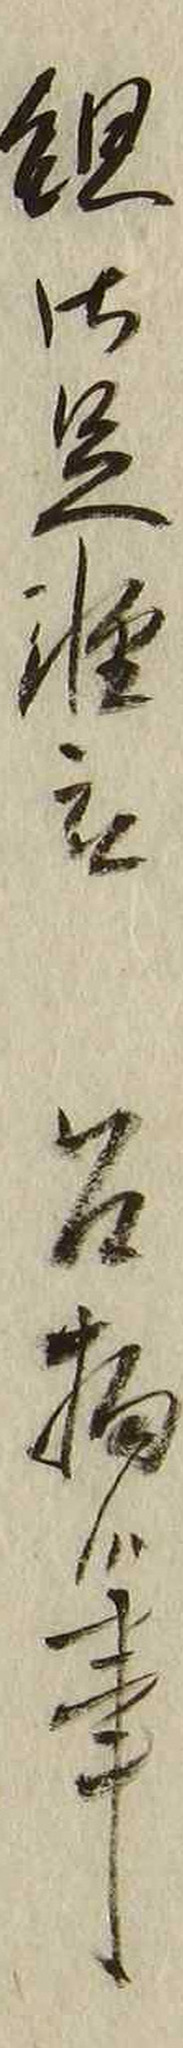組御足軽被召抱候事
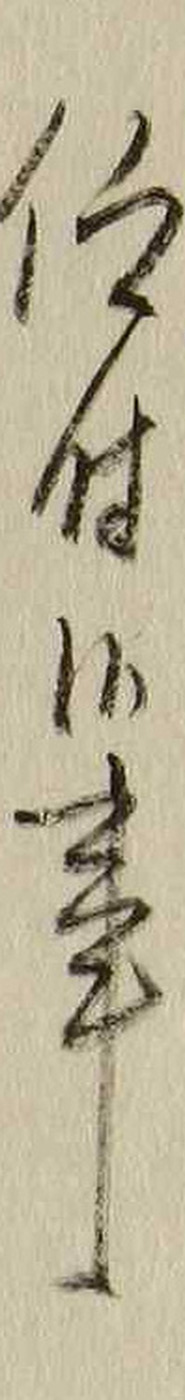仰付候事
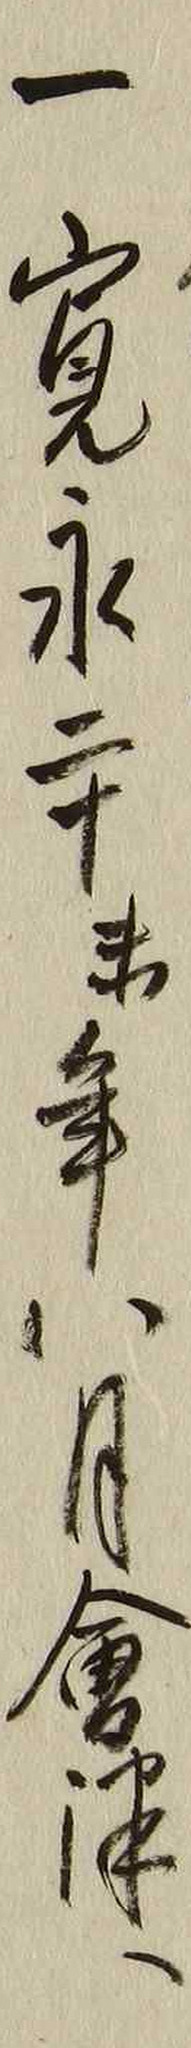一寛永二十未年八月会津へ
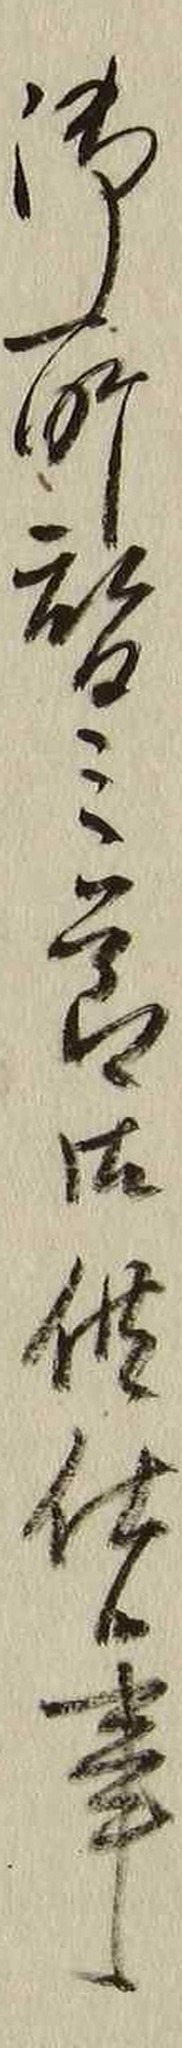御所替之節御供仕候事
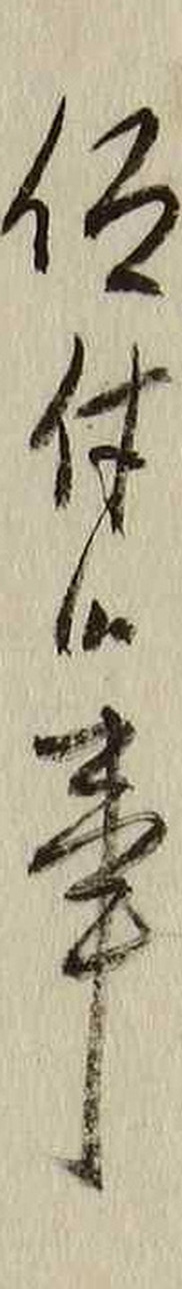仰付候事
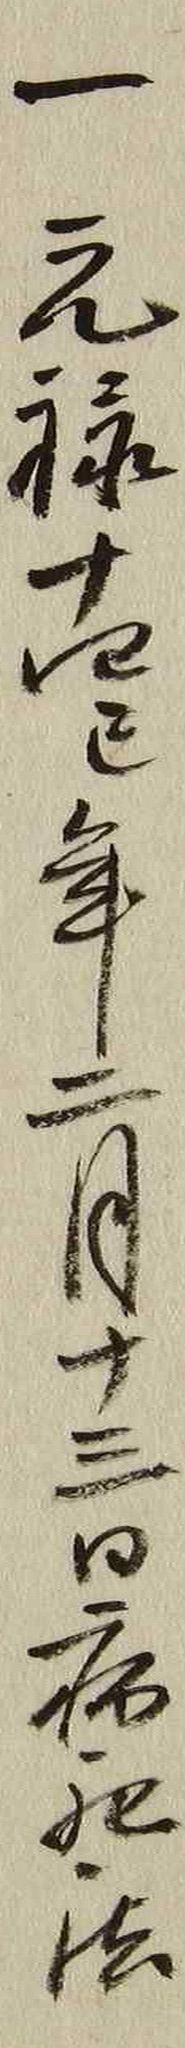一元禄十四巳年二月十三日病死法
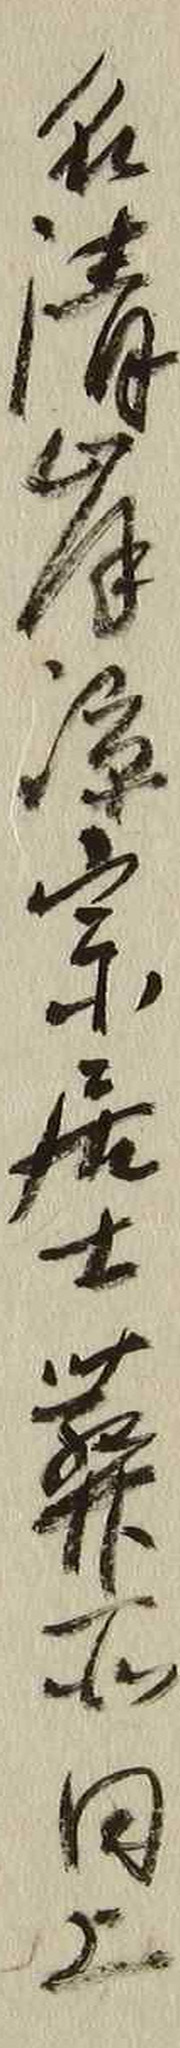名清岸涼宗居士葬所同上
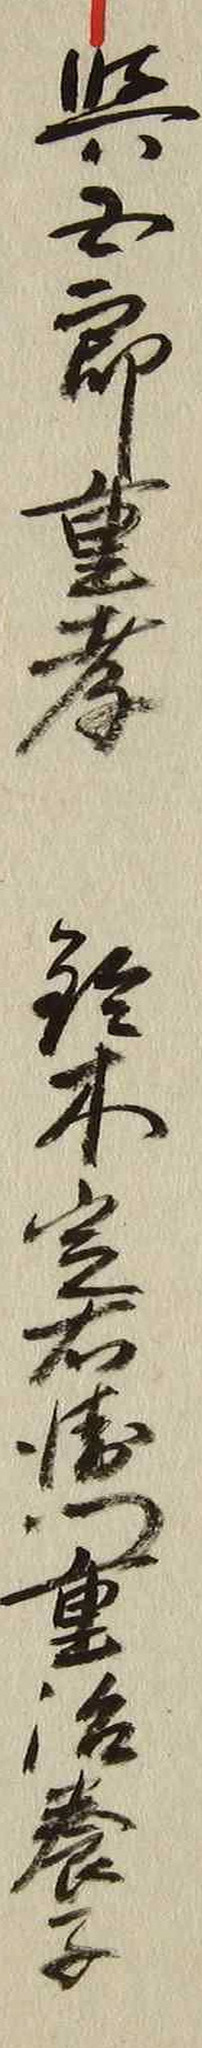与五郎重孝鈴木定右衛門重治養子
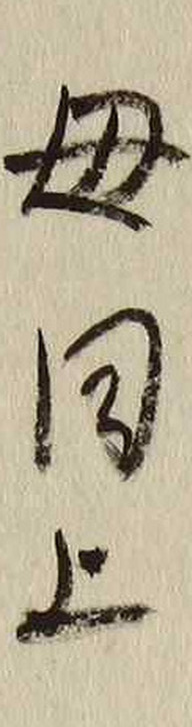母同上
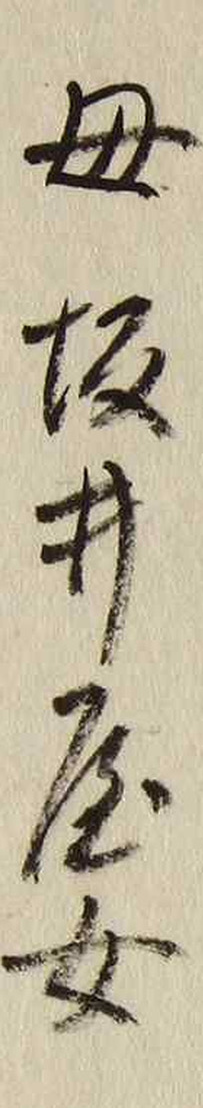母坂井屋女
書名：諸士系譜　巻之353　す之部3
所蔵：会津若松市立会津図書館
